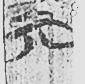亓
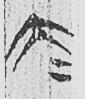夫=
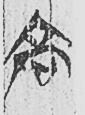高
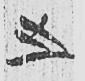之
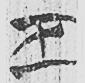巨
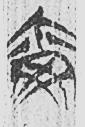爾
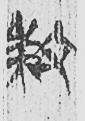殺
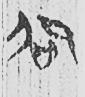卲
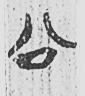公
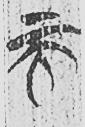而
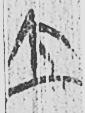立
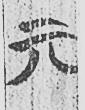亓
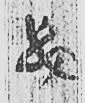弟
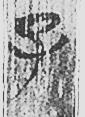子
